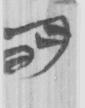明
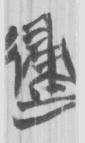歸
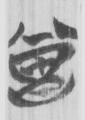曾
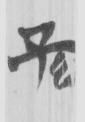孫
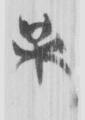某
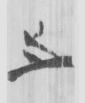之
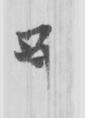邑
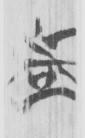者
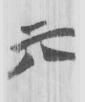亓
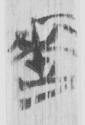麥
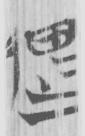{辶田}=
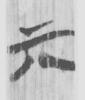亓
